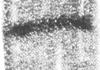一
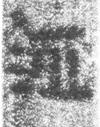○（俎）
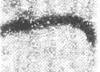一
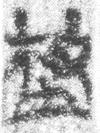{艸土付}
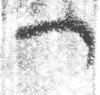一
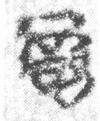○（鸞）
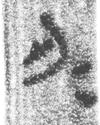刀
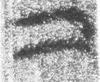二
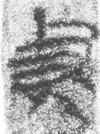鼎
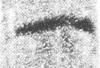一
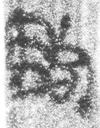鉤
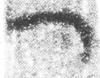一
